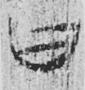曰
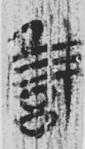○（雍）
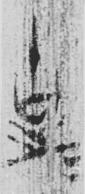古之
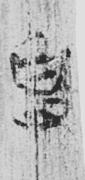事？（事）
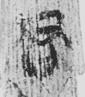君
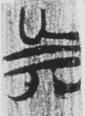者
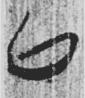㠯（以）
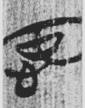忠
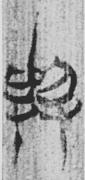與
